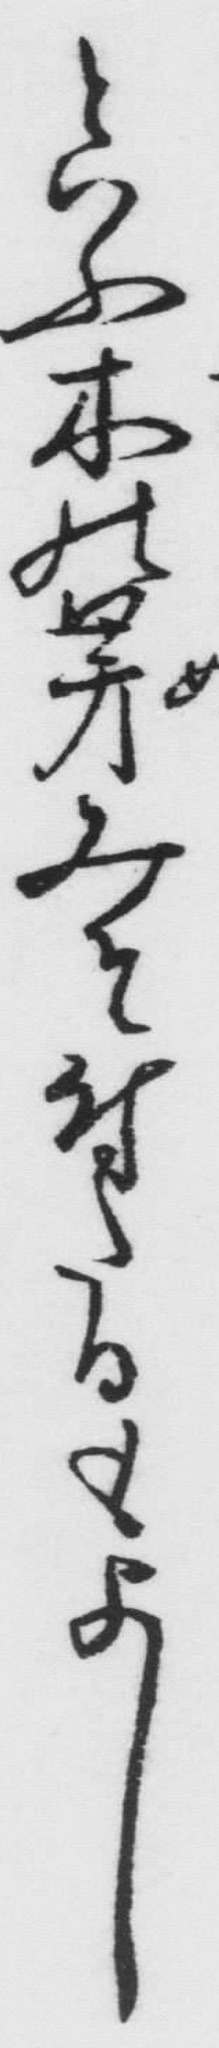といふ木の芽みそ付たるもよし
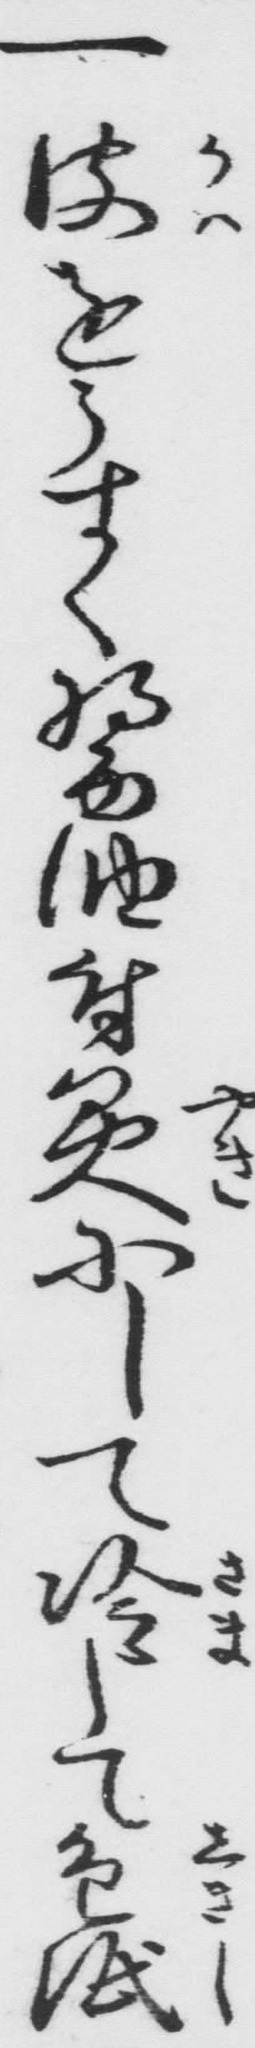一皮をうすく醤油付炙にして冷して色紙
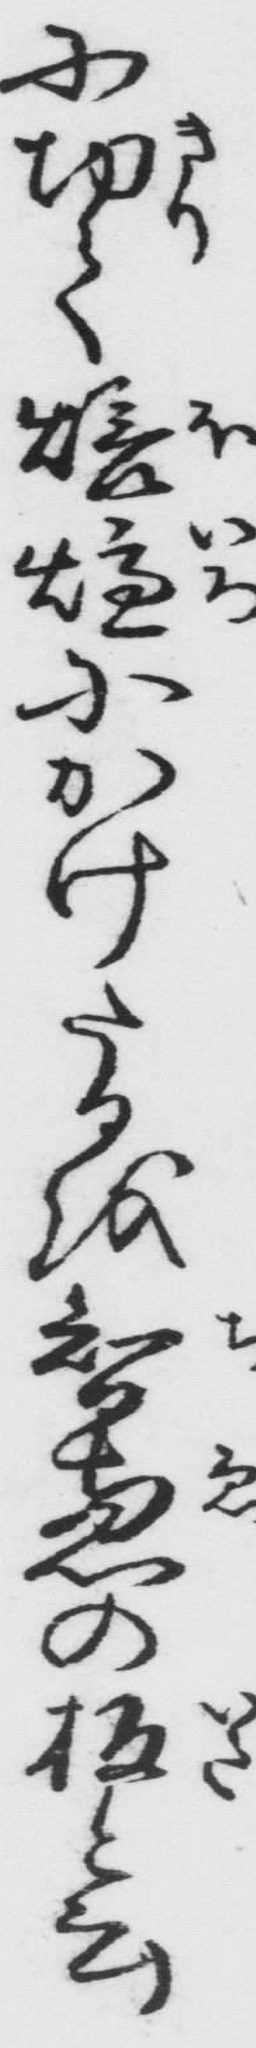に切て焙爐にかけたるを智恵の板と云
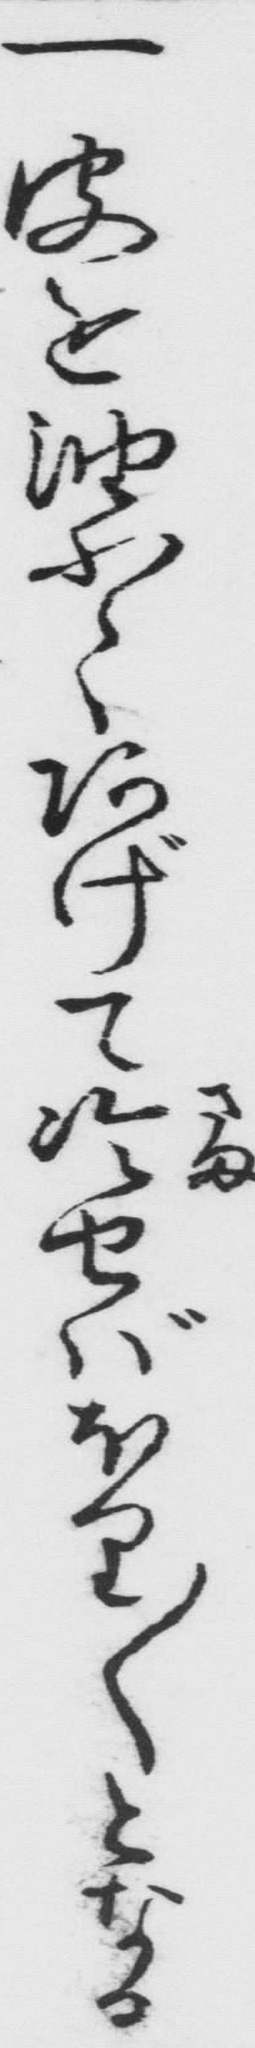一皮を油にてあげて冷せばほり〳〵となる
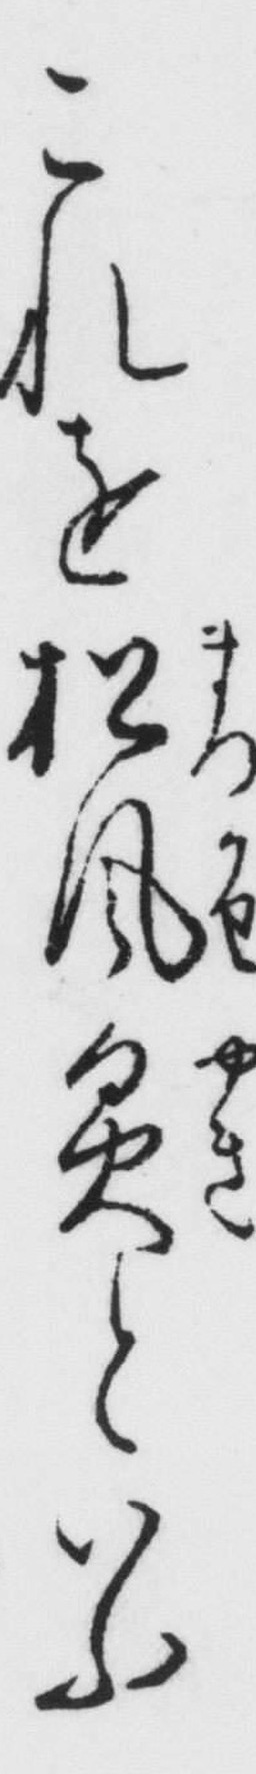これを松風炙といふ
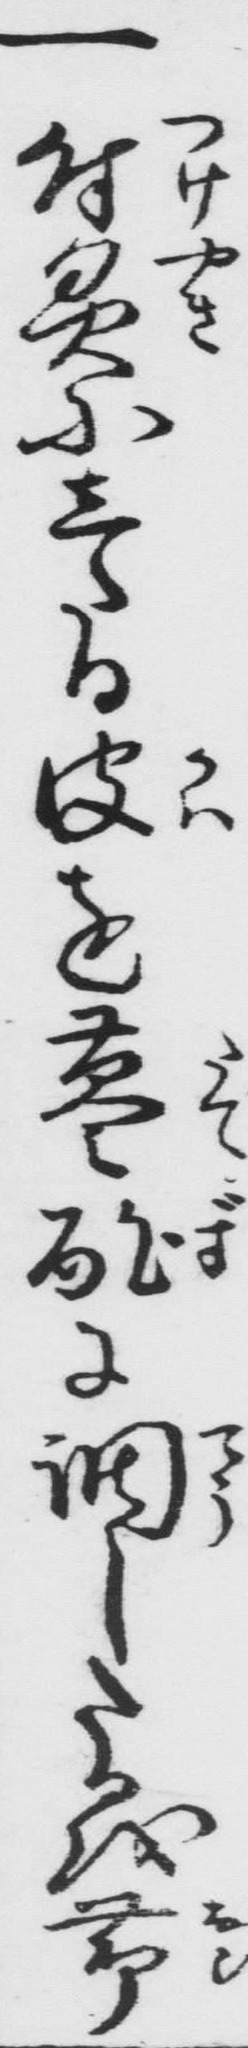一付炙にしたる皮を蓼酢に調したるを帯
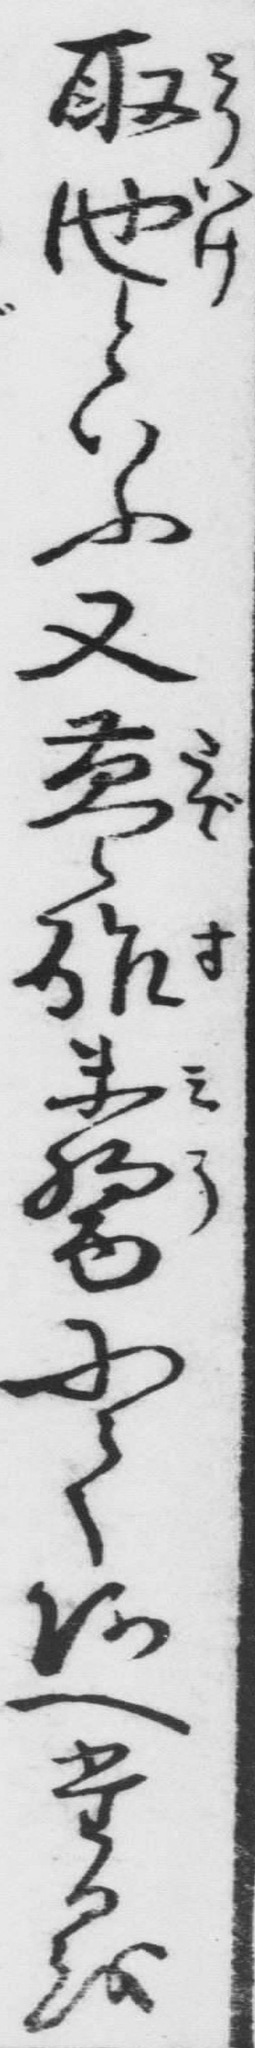取池といふ又蓼酢未醤にてあへたるを
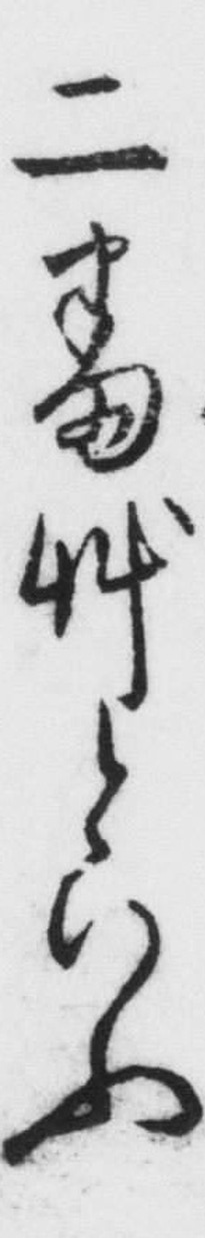二番艸といふ

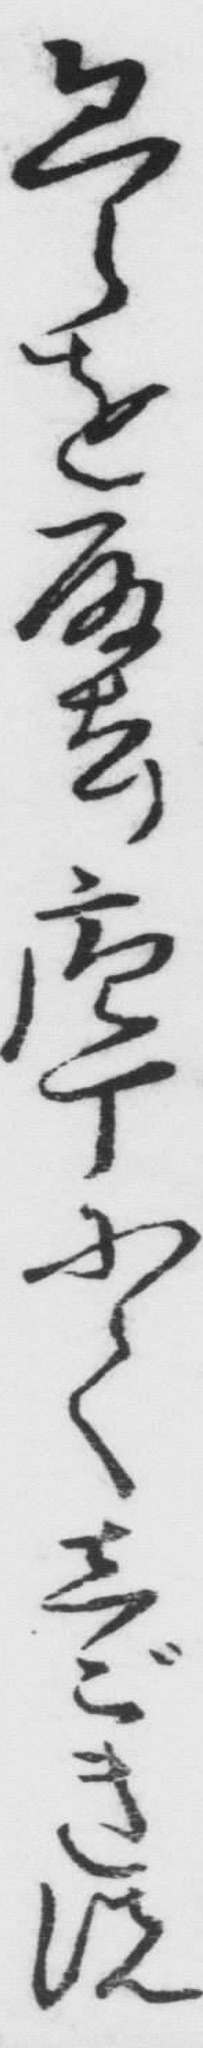ゑらを取去庖丁にてしごき洗
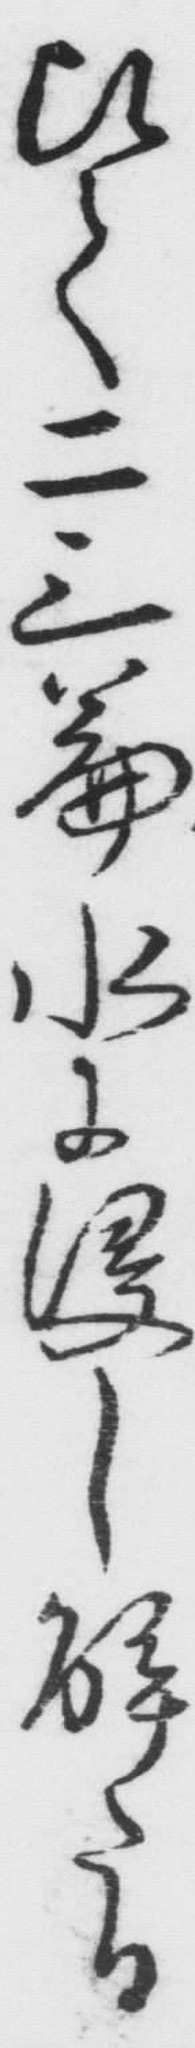ひて二三篇水に浸し解たる
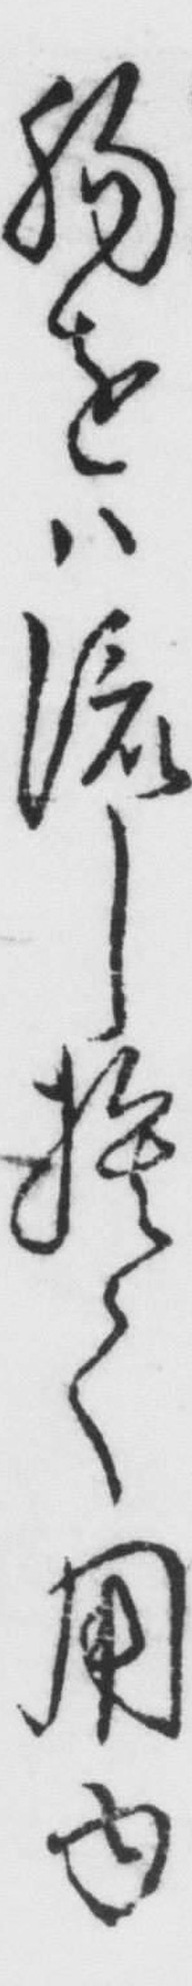腸をは流し捨て用ゆ
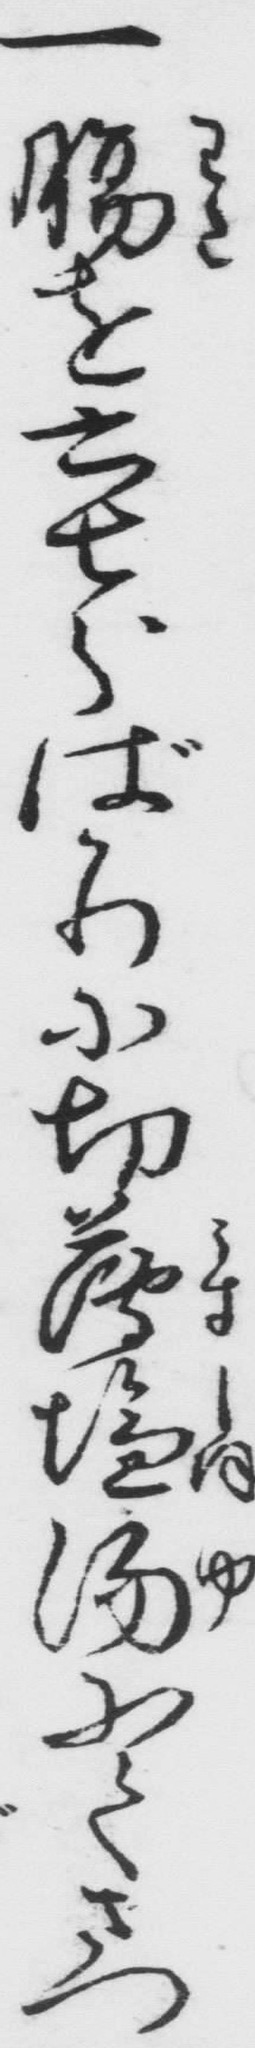一腸を六七分ばかりに切薄塩湯にてさつ
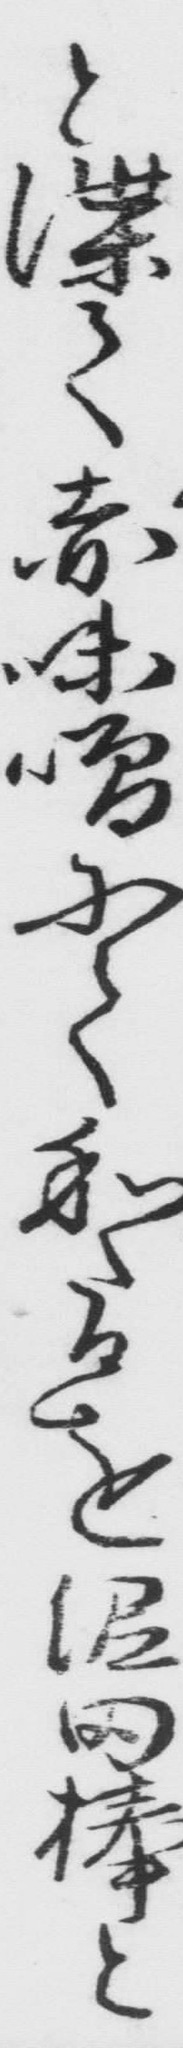と渫て赤味噌にて和たるを泥田棒と
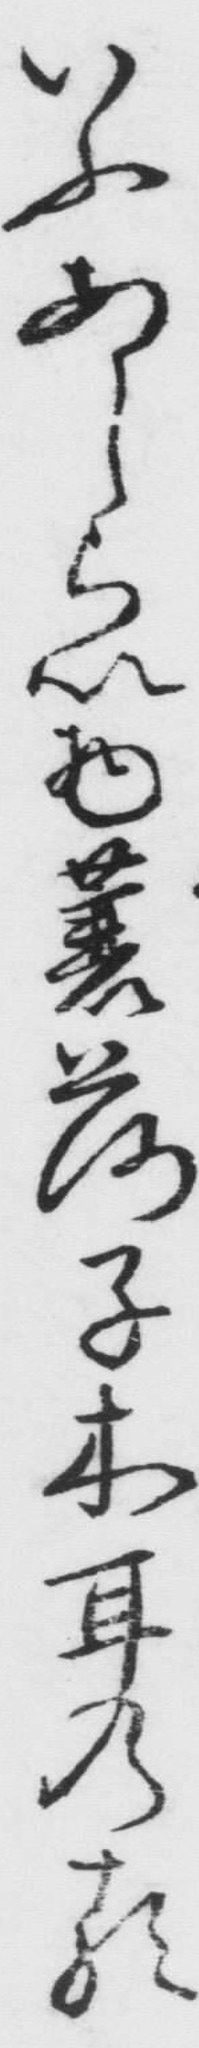いふあしらい物蘘荷子木耳の類
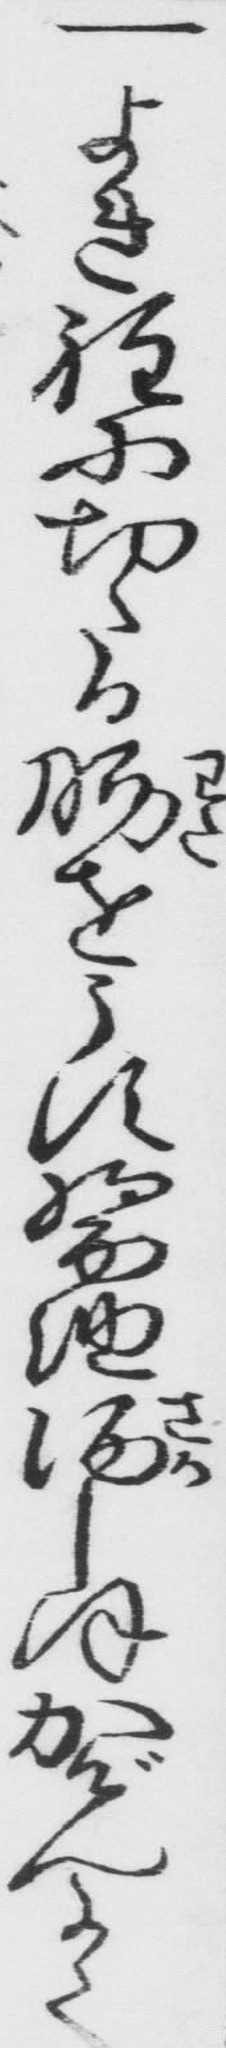一よき程に切たる腸をうす醤油酒しほかげんよく
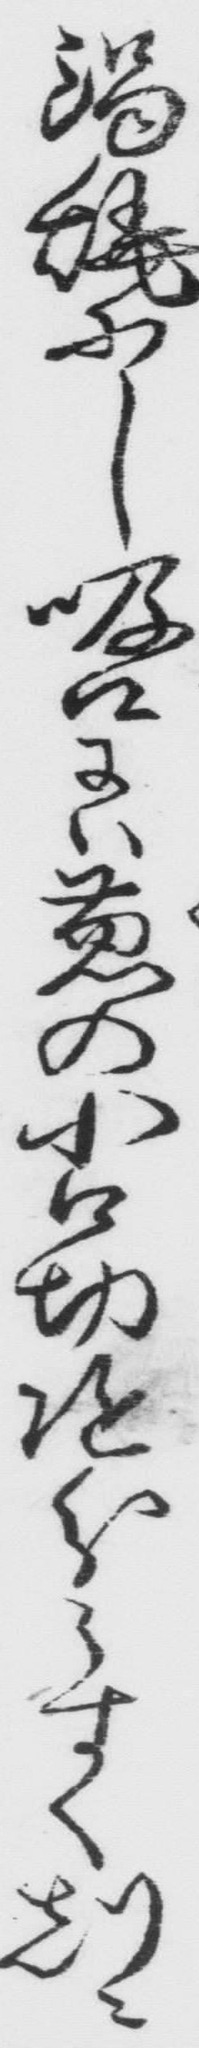鍋燒にし吸口には葱の小口切随分うすく刻に
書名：海鰻百珍
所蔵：大阪府立大学学術情報センター 国文学研究資料館
